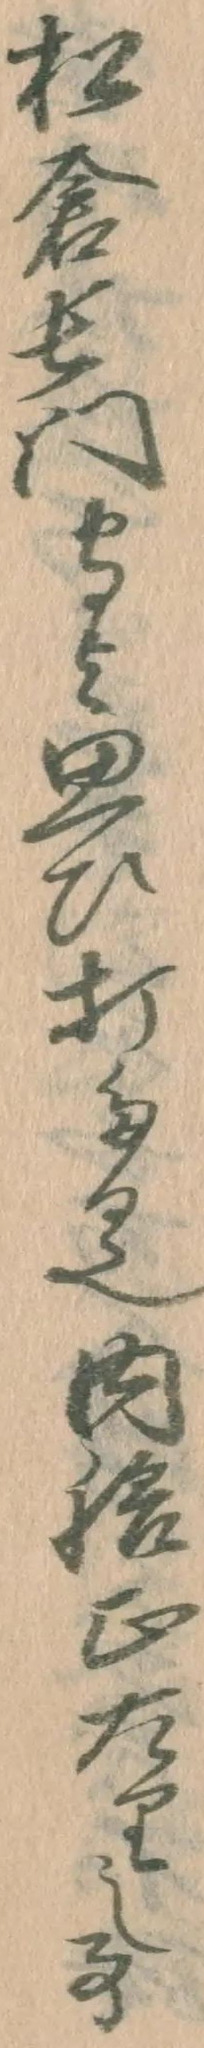松倉長門守与思ひ打多る也内膳正た里之事
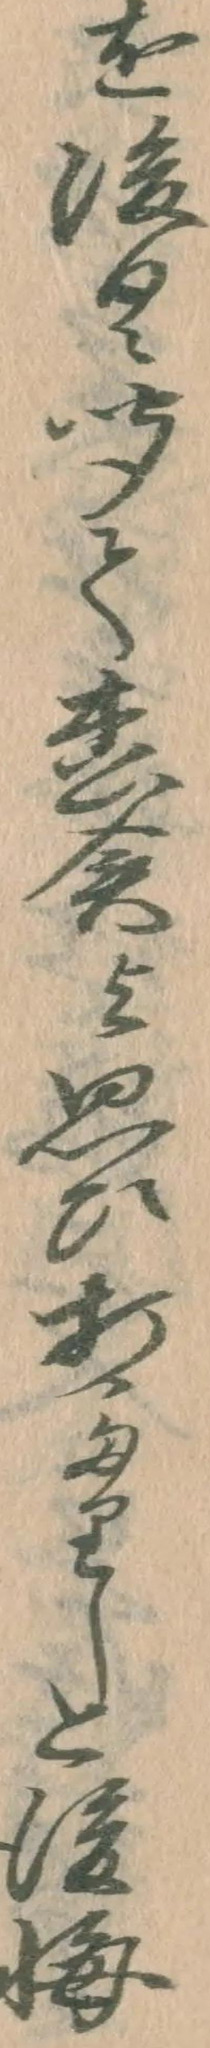を後日に聞て枩倉与思ひ打多里しと後悔
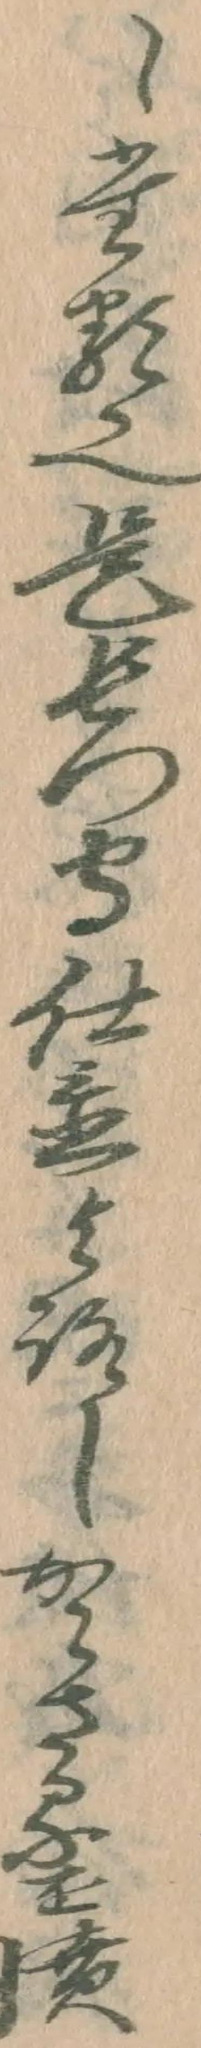し堂類也是長門守仕置与語しからさるを憤
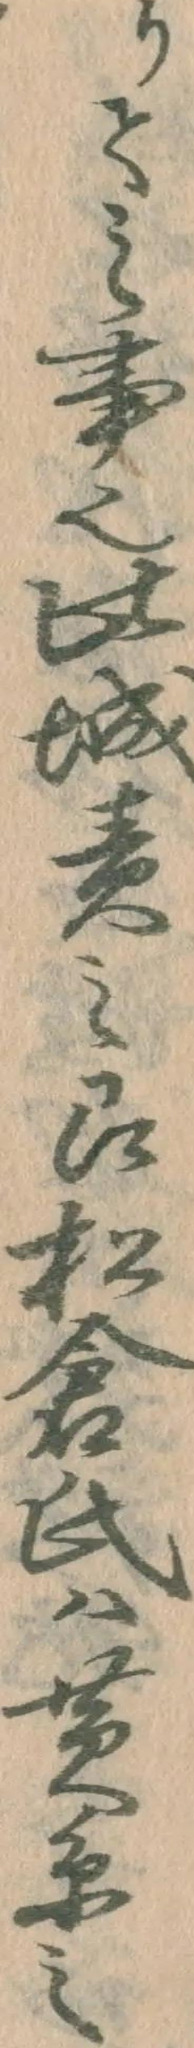りて之事也此城責之即松倉氏は黄色之
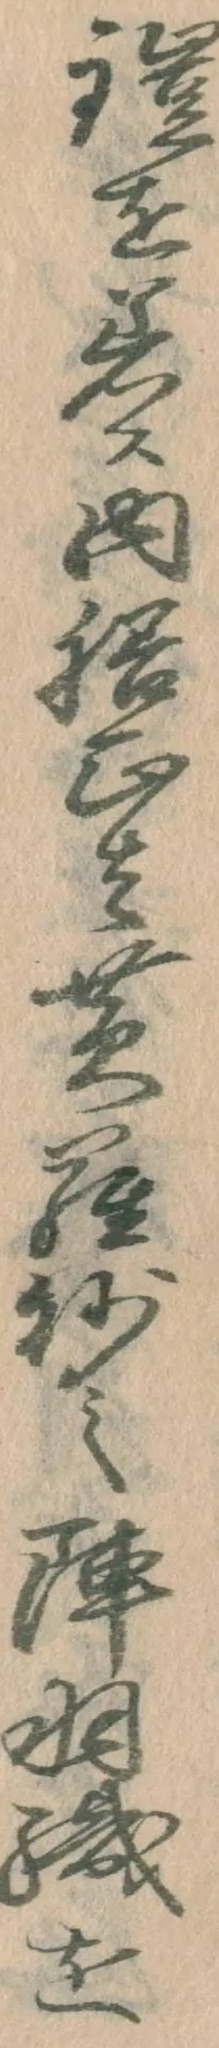鎧を着す内膳正者黄羅紗之陣羽織を
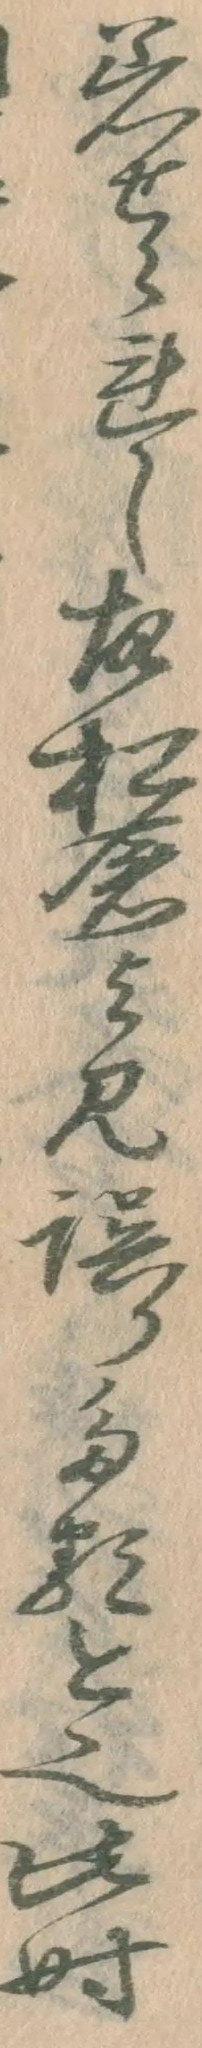着せら連し故松倉与見誤り多類と也此時
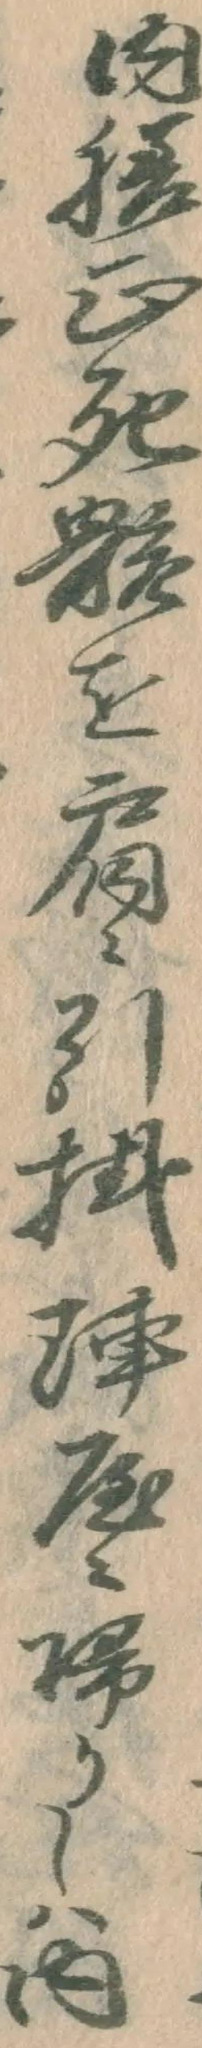内膳正死骸を肩に引掛陣屋に帰りしは内
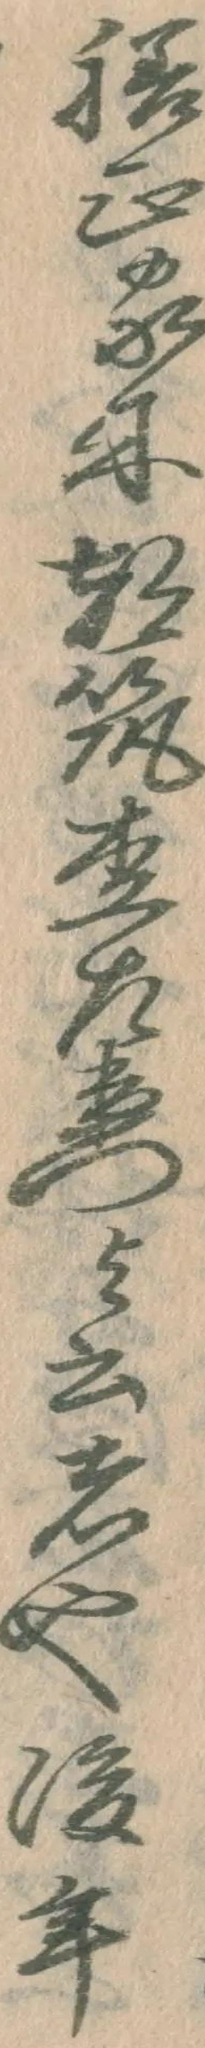膳正家来都築杢左衛門与云者也後年
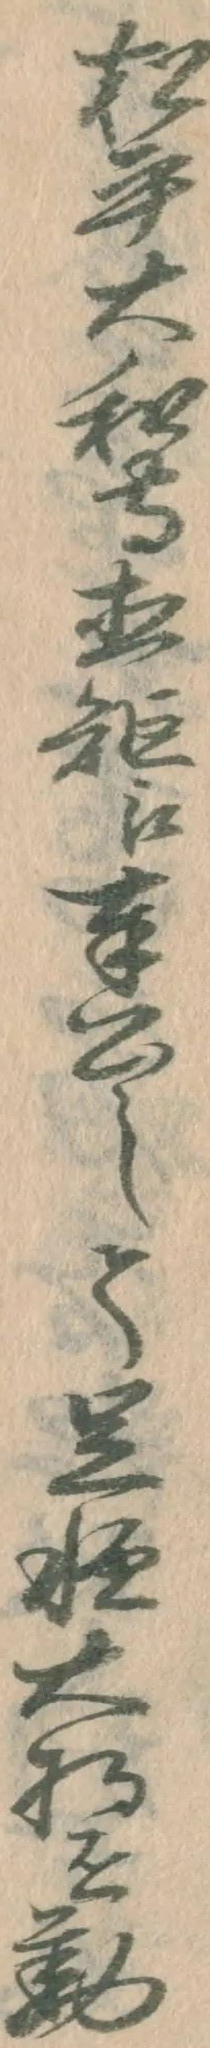松平大和守直矩江奉公して足軽大将を勤
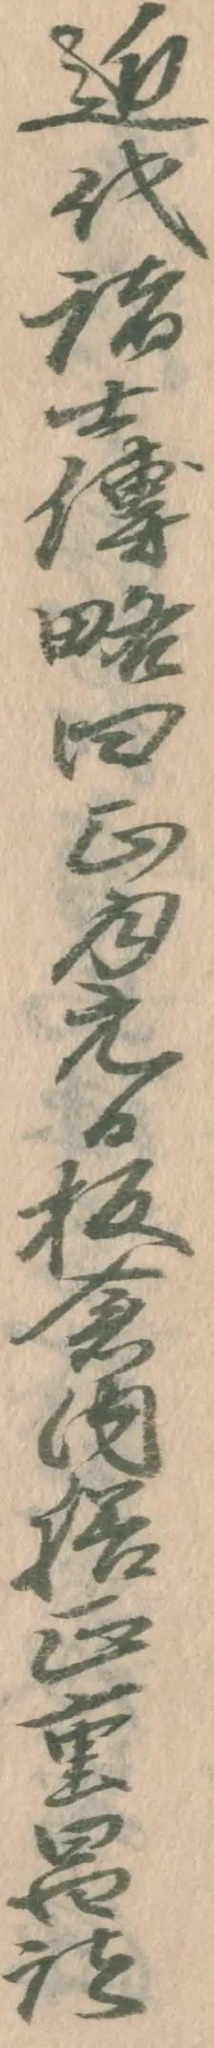近代諸士伝略曰正月元日板倉内膳正重昌諸

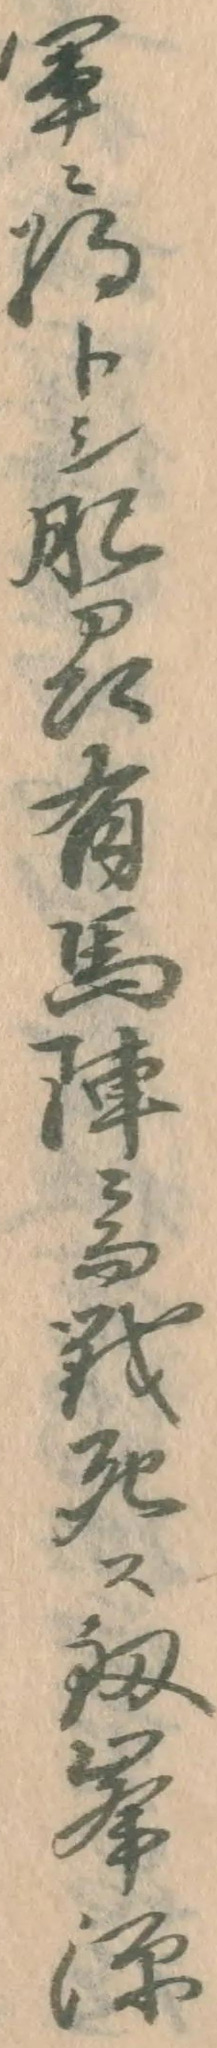軍に将とし肥州有馬陣に而戦死す釼峯原源
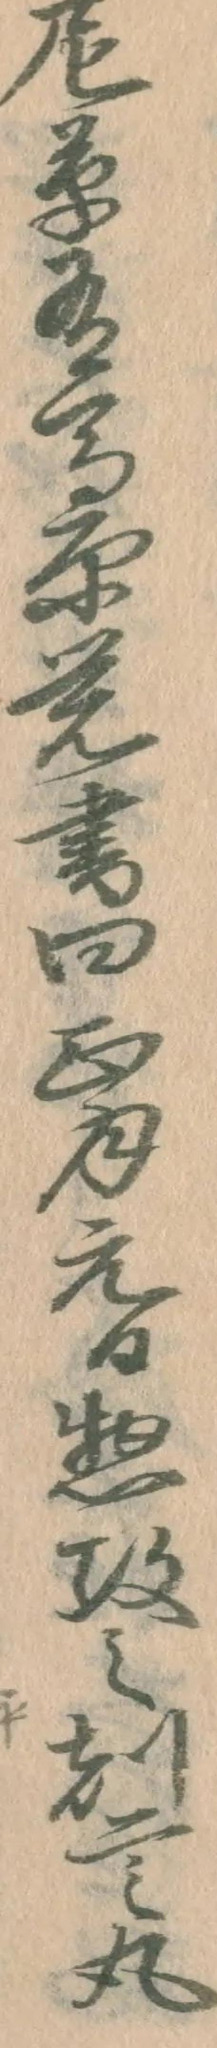尼草有馬原覚書曰正月元日惣攻之刻二之丸
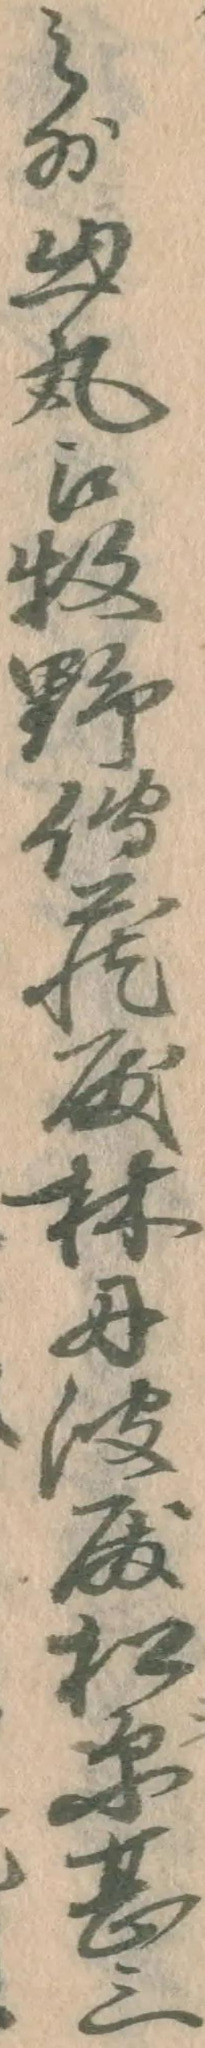之外出丸江牧野伝蔵殿林丹波殿松平甚三
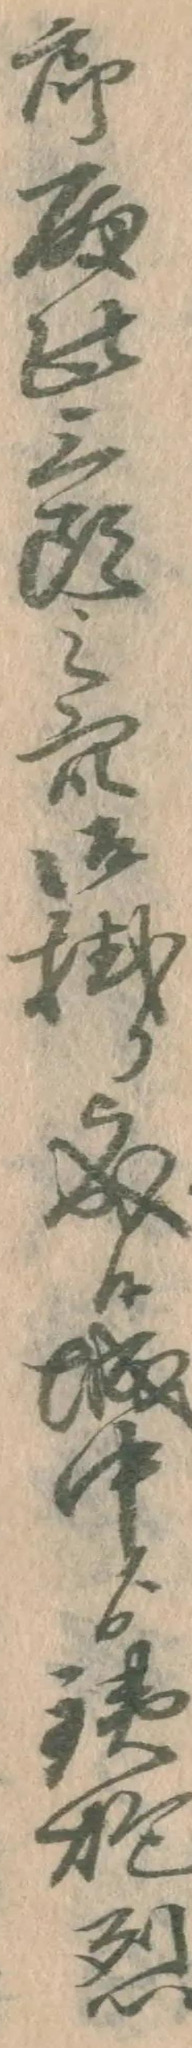郎殿此三頭之衆御掛り被成候城中ゟ鉄炮烈
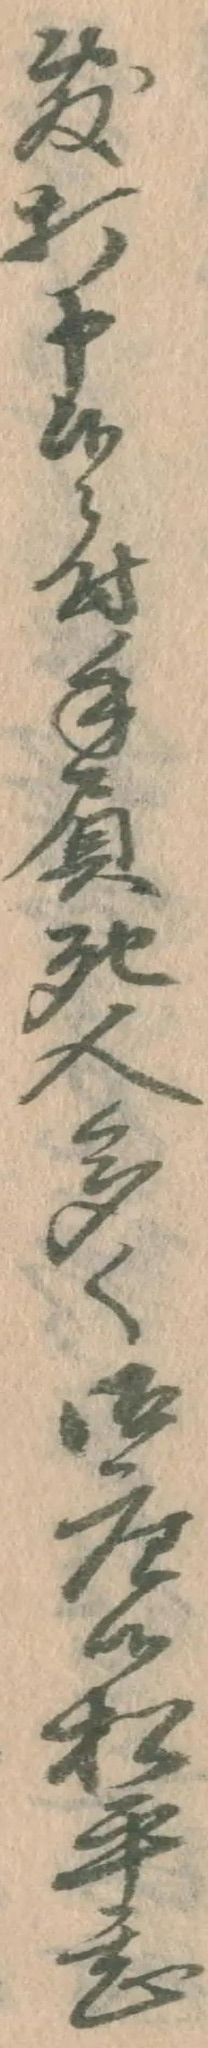敷打申候に付手負死人多く御座候松平甚
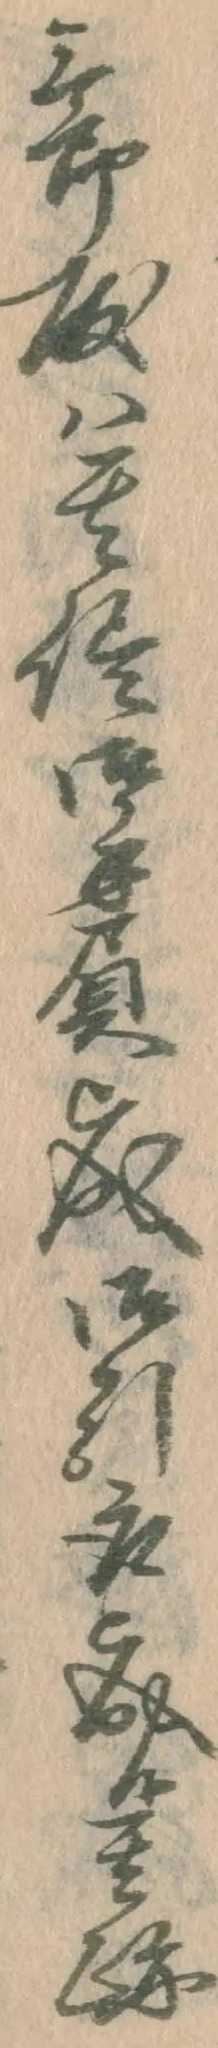三郎殿は其侭御手負被成御引取被成候其跡
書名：切支丹御退治記 49巻. [5]
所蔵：国立国会図書館 National Diet Library, JAPAN
